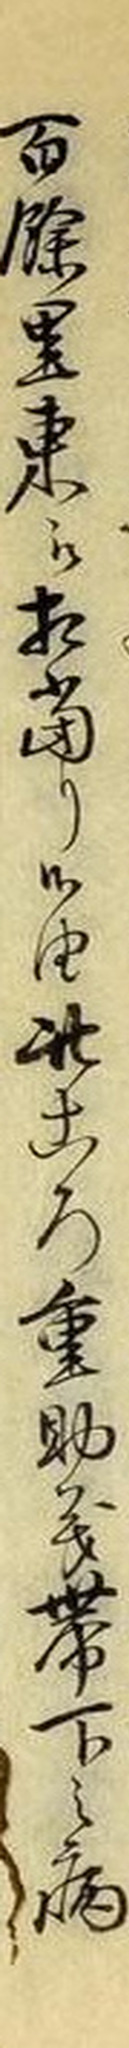百余里東江相当り候由此ころ重助義帯下の病
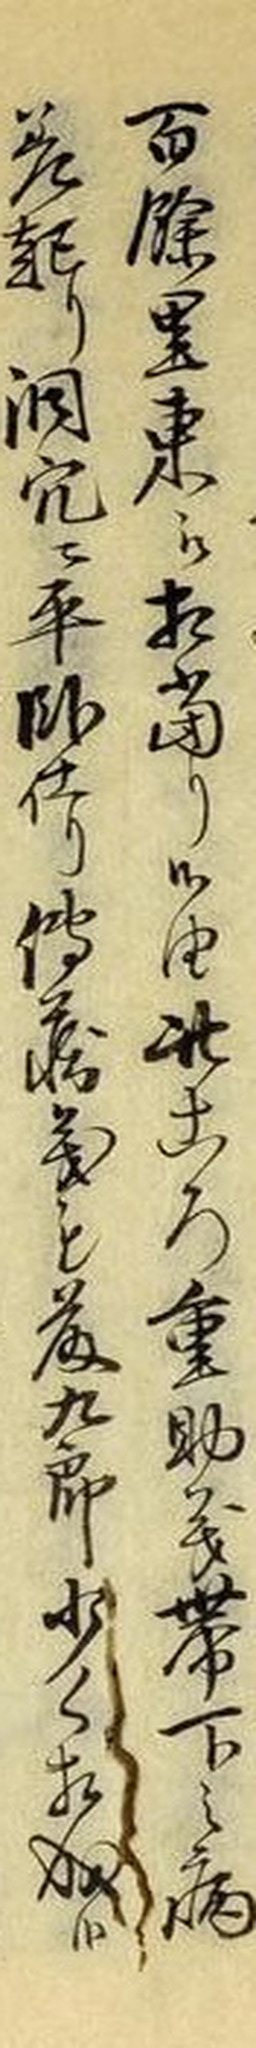差起り洞穴ニ平臥仕り傳蔵義も藤九郎少く相成候
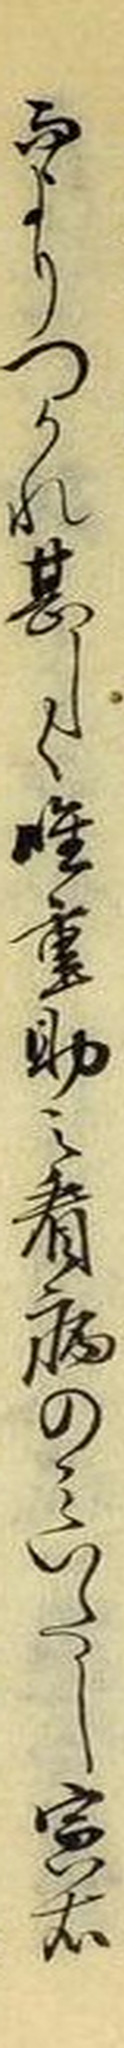而よりつかれ甚しく唯重助之看病のミいたし寅右
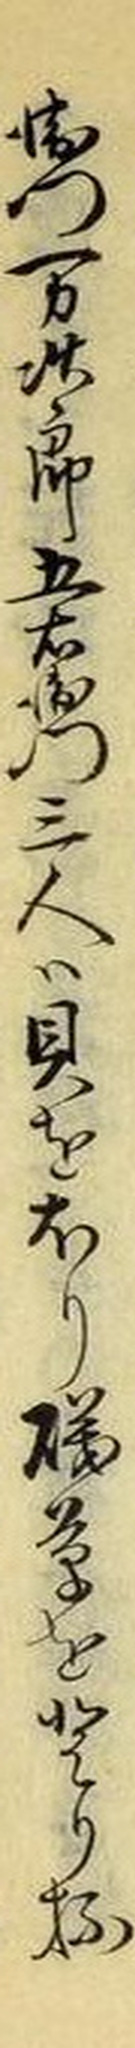衛門万次郎五右衛門三人ハ貝をほり磯草をとり抔
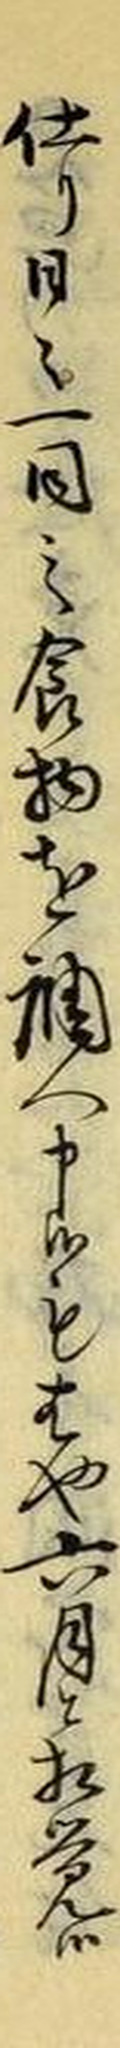仕り日々一同之食物を調へ申候もはや六月と相覚候
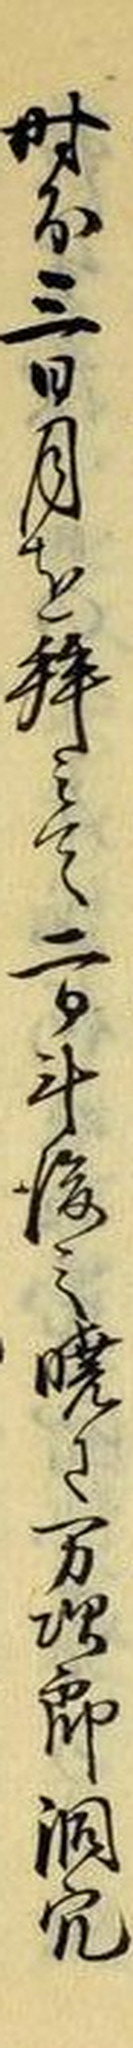時分三日月を拝ミて二日計後の暁に万次郎洞穴
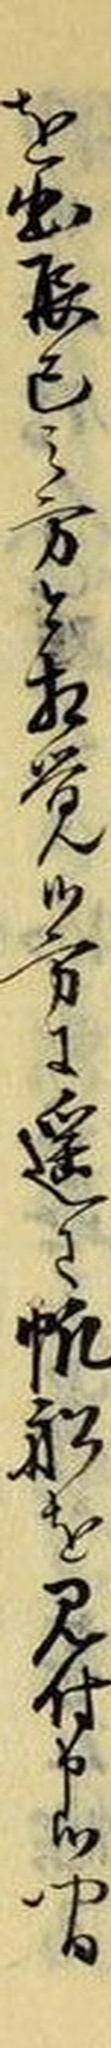を出辰巳の方と相覚候方に遥に帆船を見付申候間
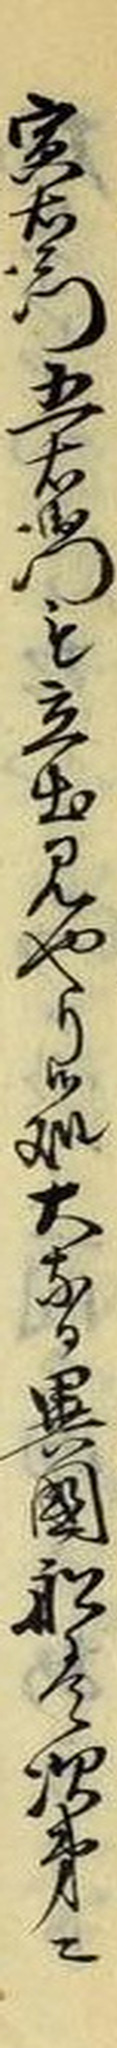寅右衛門五右衛門も立出見やり候処大なる異国船にて次第ニ
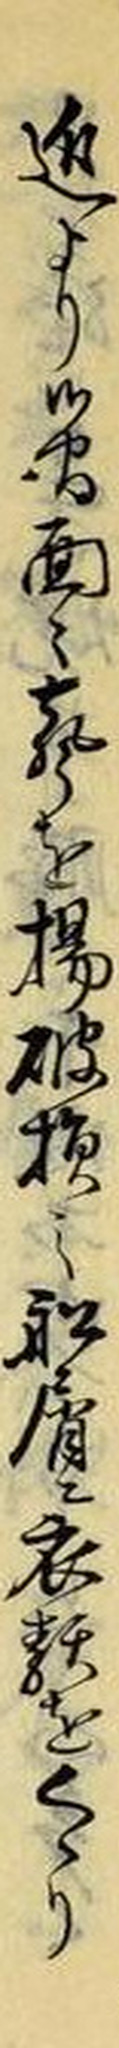近より候間面々声を揚破損の船屑ニ衣類をくゝり
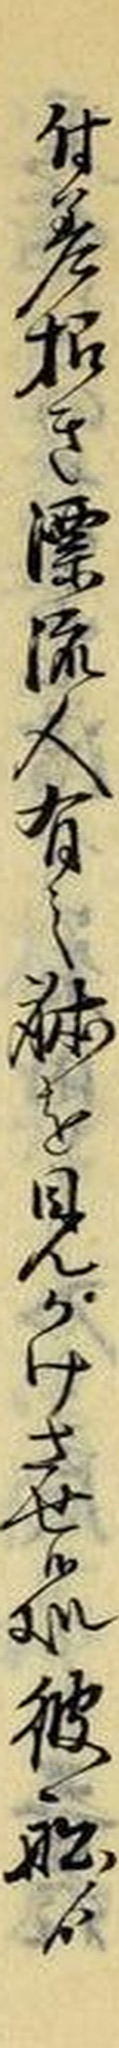付差招き漂流人有之躰を見かけさせ候処彼船ゟ
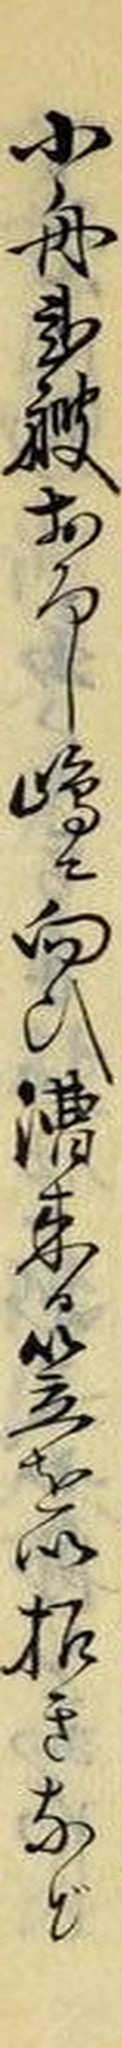小船貮艘おろし島ニ向ひ漕来る笠を以招きなど
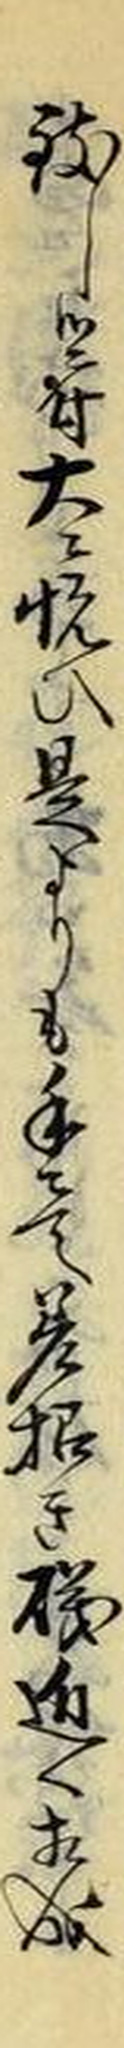致し候ニ付大ニ悦ひ是よりも手ニて差招き磯近く相成
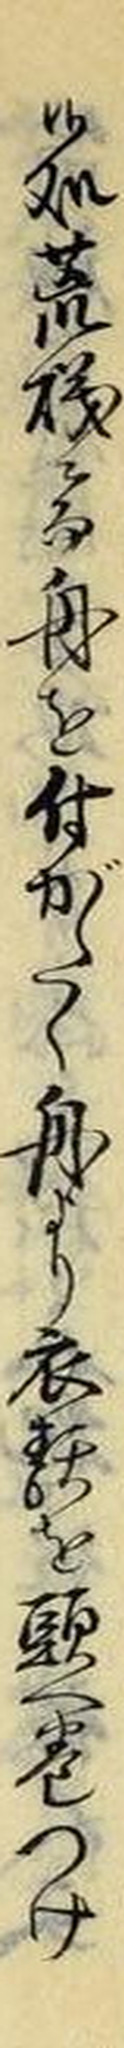候処荒磯ニて舟を付がたく舟より衣類を頭へ巻つけ
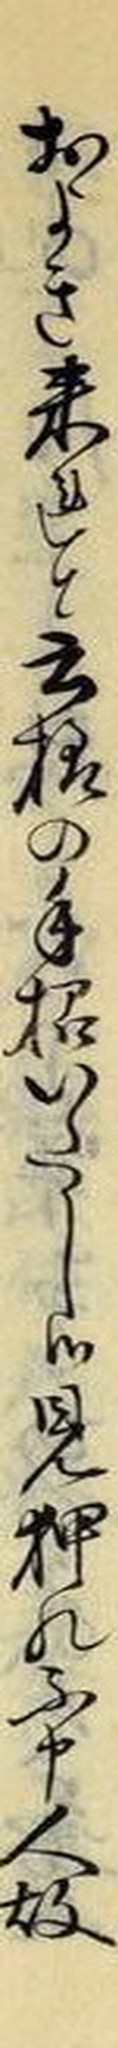およき来れと云様の手招いたし候見狎れ不申人故
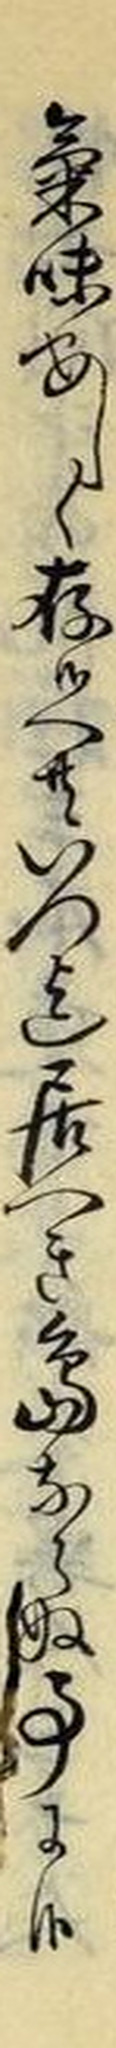気味あしく存候へ共いつ迄居へき島ならぬ事に候
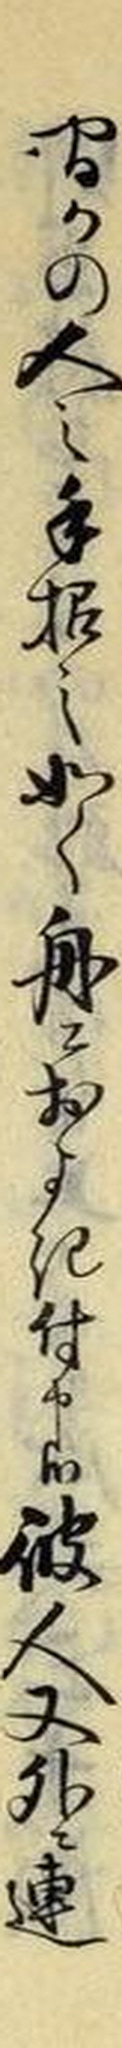間かの人之手招し如く舟ニおよき付申候彼人又外ニ連
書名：漂客談奇（備考雑録写8）
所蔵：福井県文書館 Fukui Prefectural Archives
